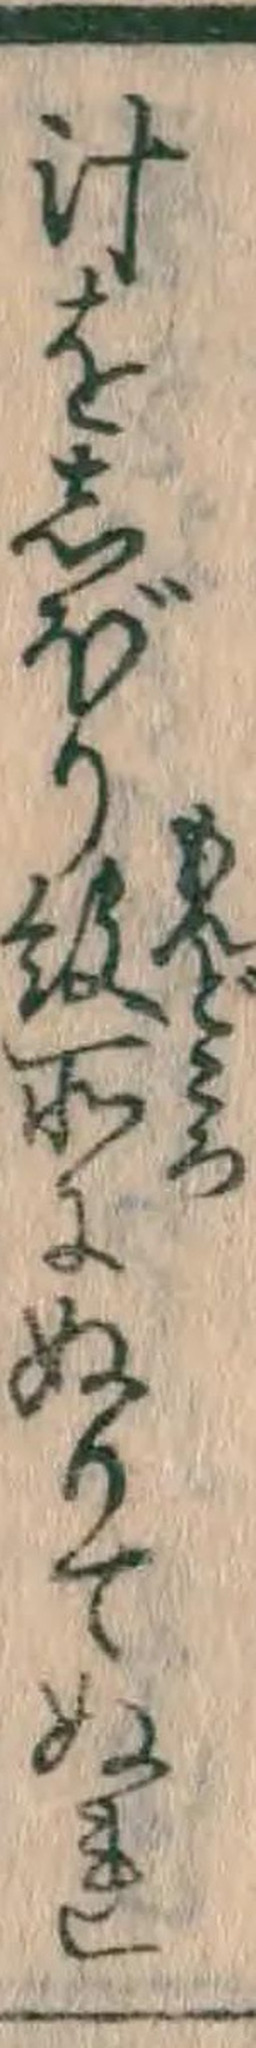汁をしぼり紋所にぬりてぬれ
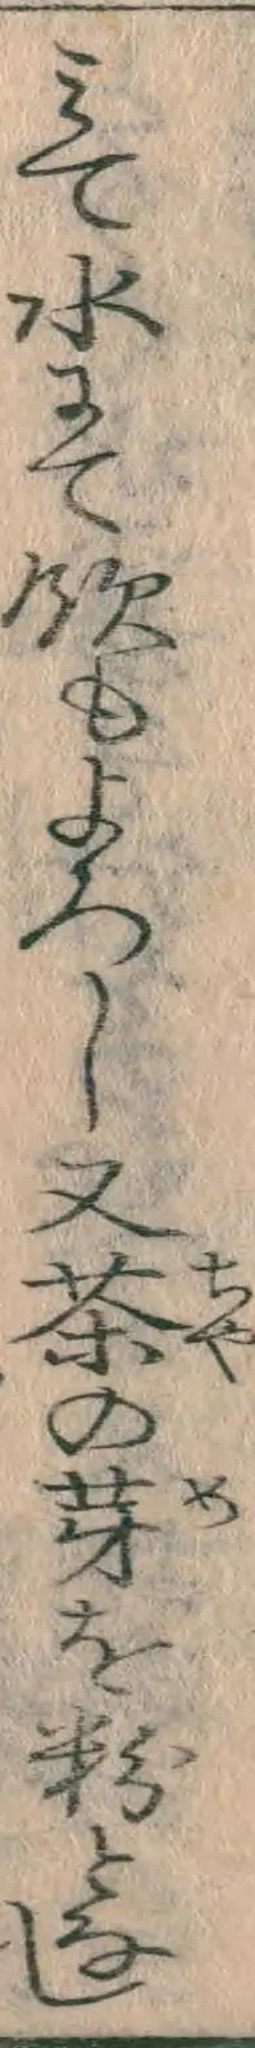みて水にて飲もよろし又茶の芽を粉となし
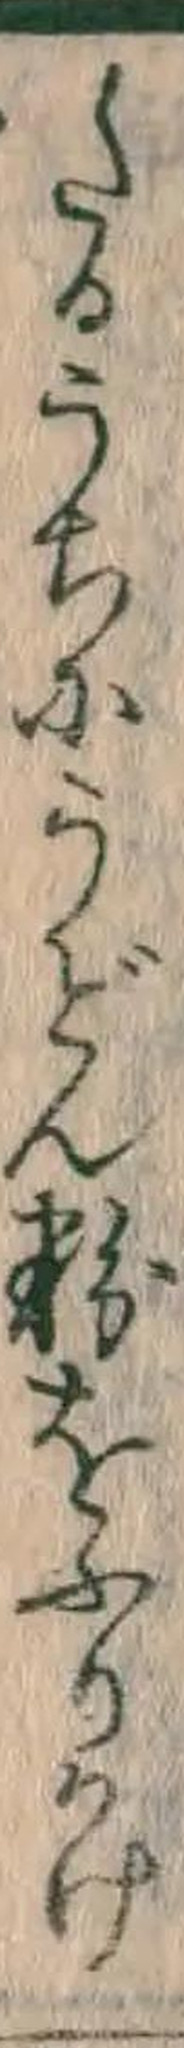たるうちにうどん粉をふりかけ
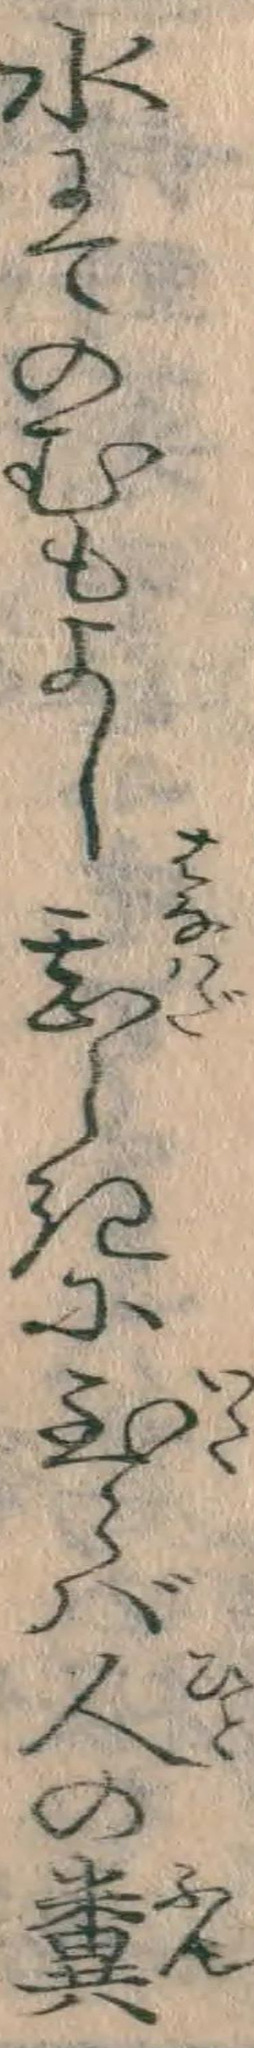水にてのむもよし甚しきに至らば人の糞
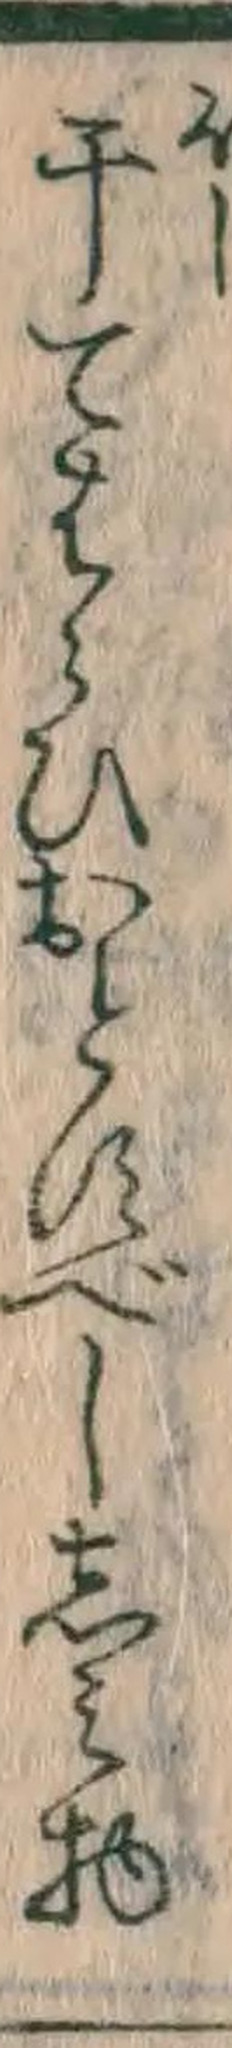干てはらひおとすべししみ物
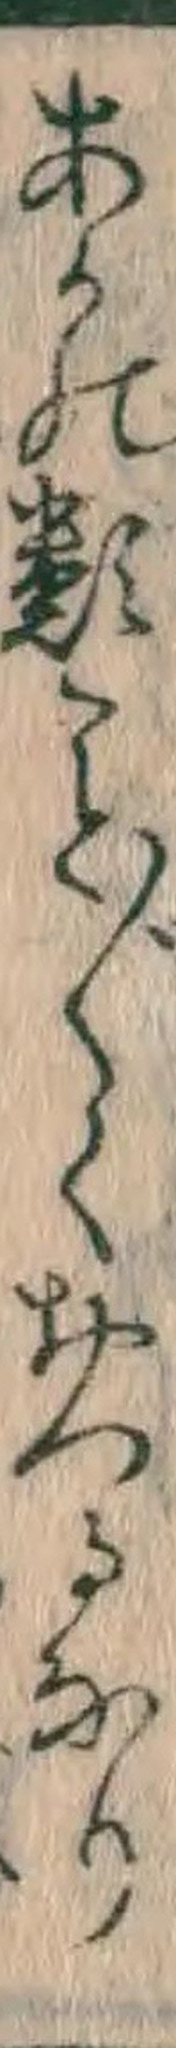あかの類こと〴〵くおつるなり
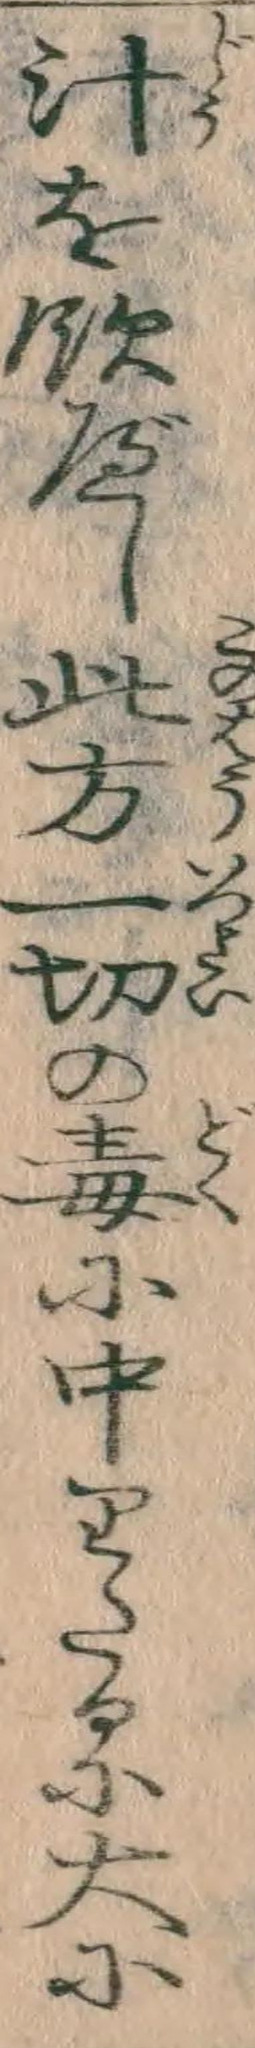汁を飲べし此方一切の毒に中りたるに大に
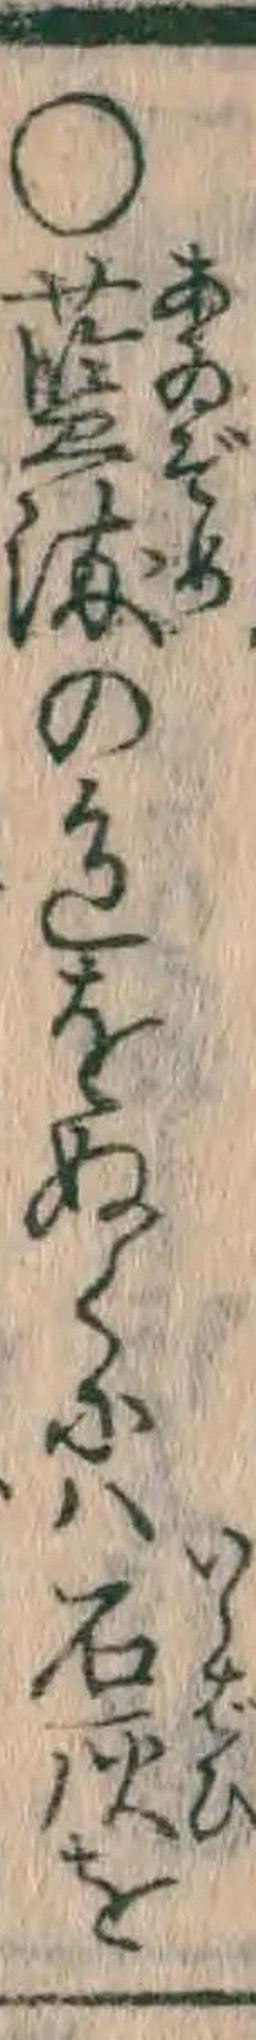○藍染の色をぬくには石灰を
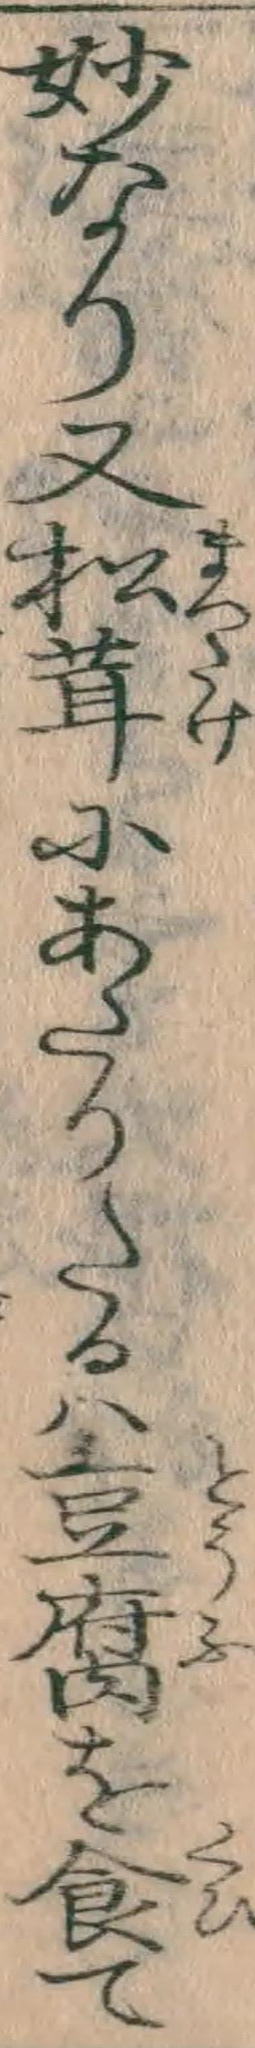妙なり又松茸にあたりたるは豆腐を食て
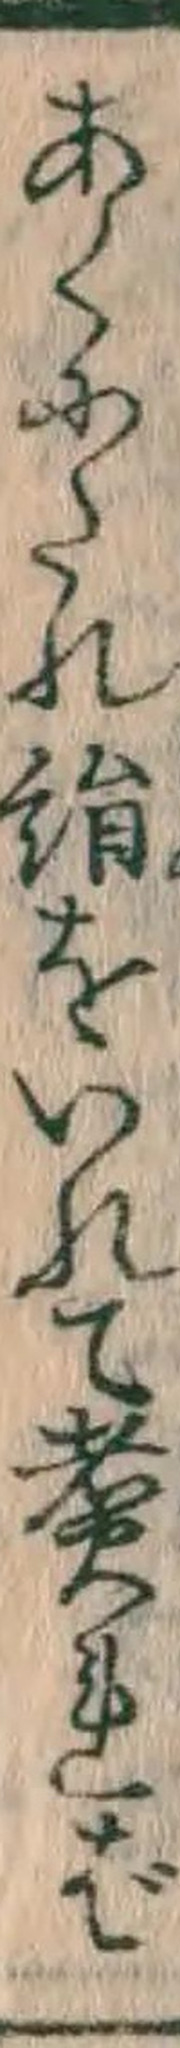あくにたれ絹をいれて煮れば
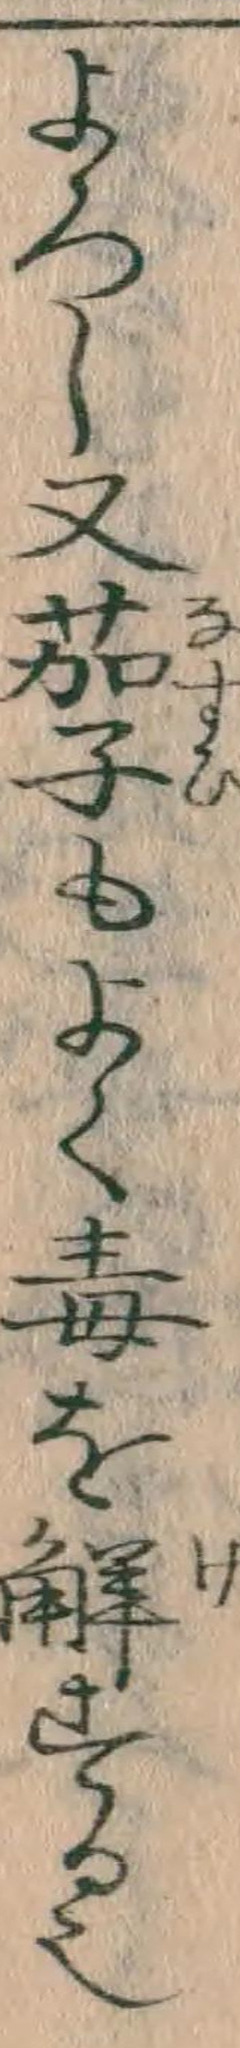よろし又茄子もよく毒を解する也
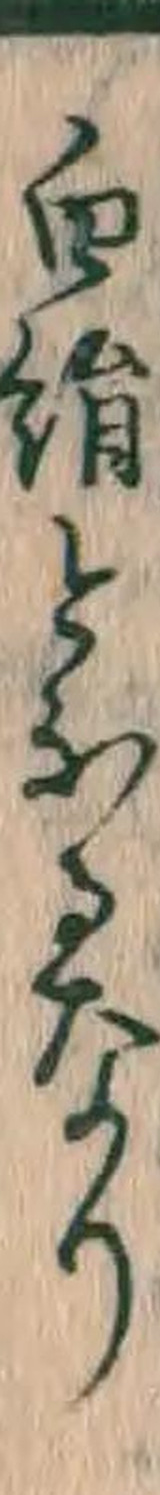白絹となるなり
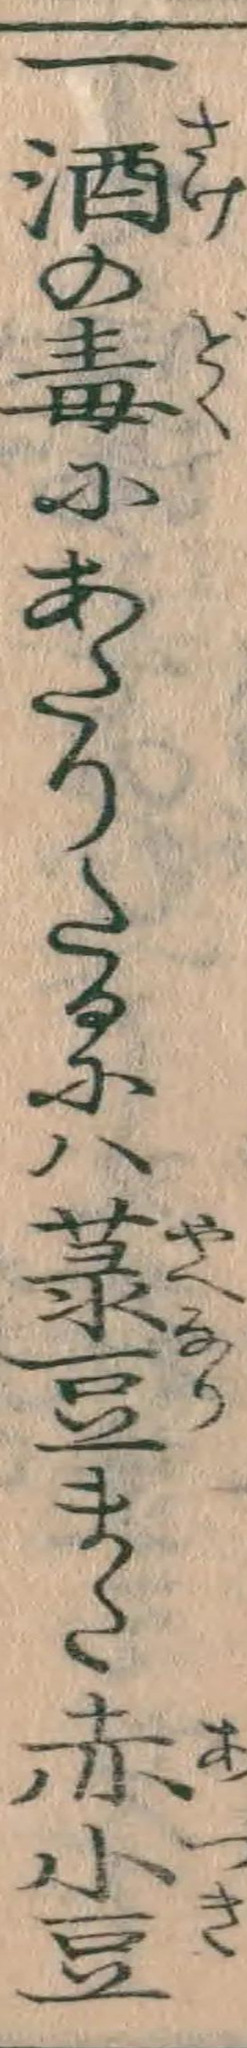一酒の毒にあたりたるには菉豆また赤小豆
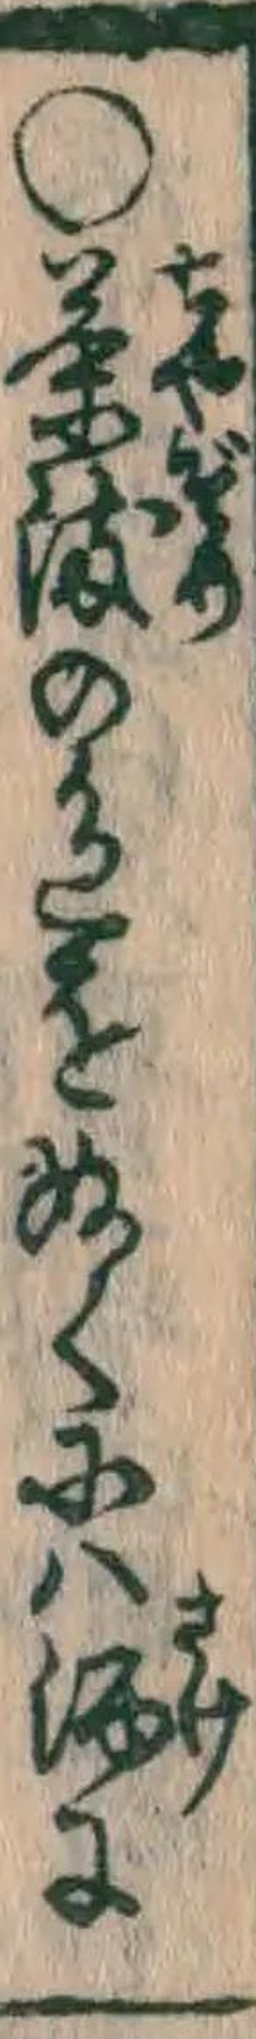○茶染の色をぬくには酒に
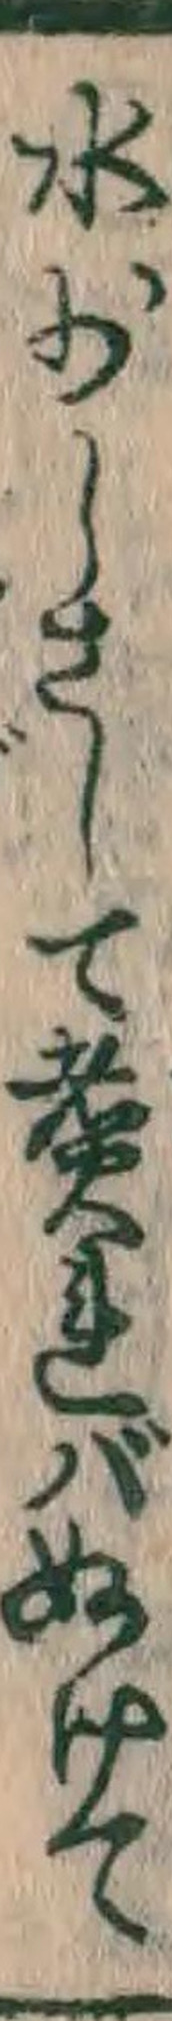水少しさして煮ればぬけて
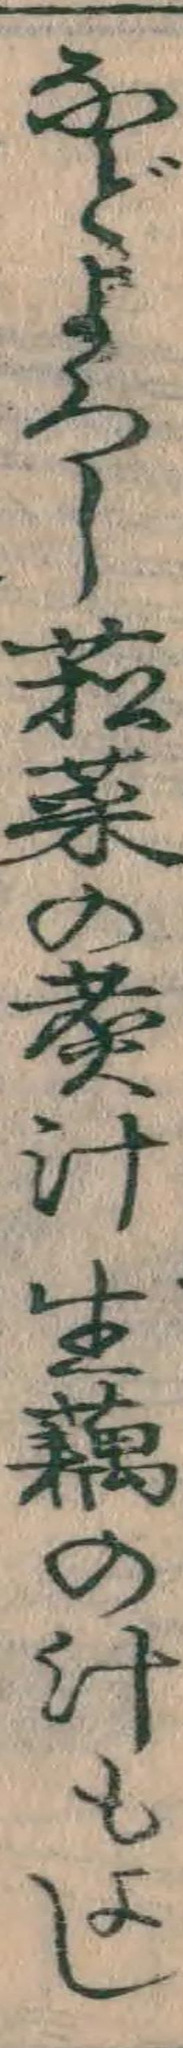などよろし菘菜の煮汁生藕の汁もよし
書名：広益秘事大全 3巻. [3]
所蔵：国立国会図書館 National Diet Library, JAPAN
